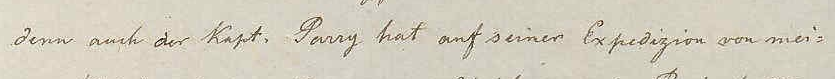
denn auch der Kapt. Parry hat auf seiner Expedizion von mei-
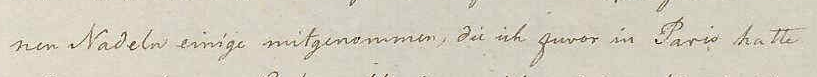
nen Nadeln einige mitgenommen, die ich zuvor in Paris hatte
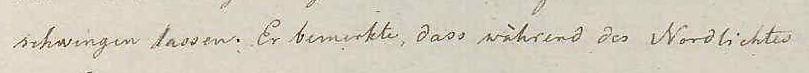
schwingen lassen. Er bemerkte, dass während des Nordlichtes
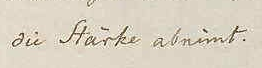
die Stärke abnimt.
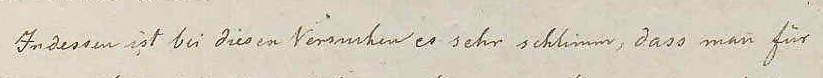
Indessen ist bei diesen Versuchen es sehr schlimm, dass man für
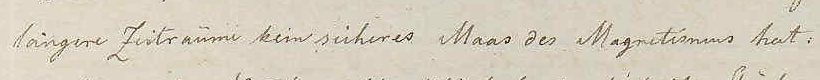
längere Zeiträume kein sicheres Maas des Magnetismus hat:
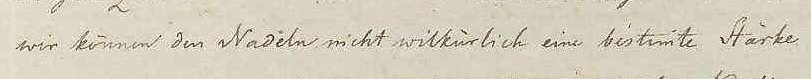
wir können den Nadeln nicht wilkürlich eine bestimte Stärke
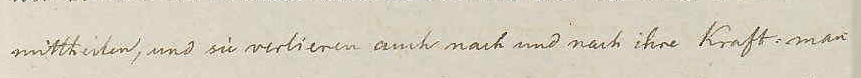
mittheilen, und sie verlieren auch nach und nach ihre Kraft: man
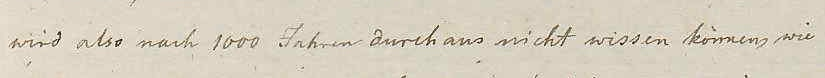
wird also nach 1000 Jahren durchaus nicht wissen können, wie
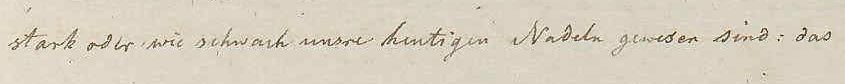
stark oder wie schwach unsre heutigen Nadeln gewesen sind: das
